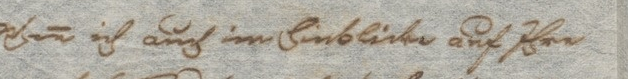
Wenn ich auch im Hinblicke auf Ihre
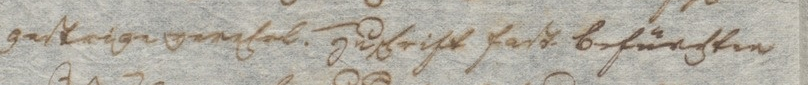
gestrige verehrl. Zuschrift fast befürchten
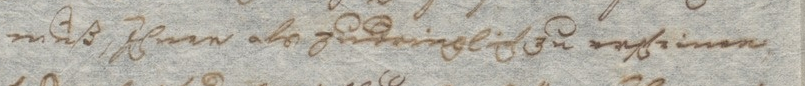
muß, Ihnen als zudringlich zu erscheinen,
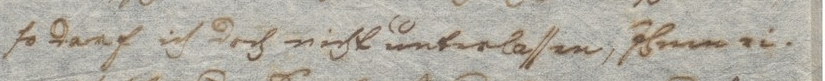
so darf ich doch nicht unterlassen, Ihnen ei-
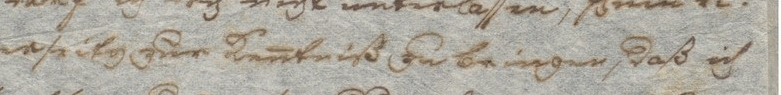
nerseits zur Kenntniß zu bringen, daß ich
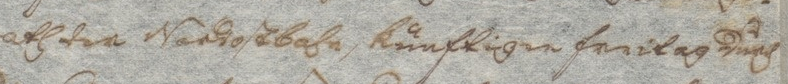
rath der Nordostbahn, künftigen Freitag durch
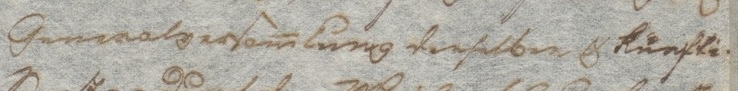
Generalversammlung derselben & künfti-
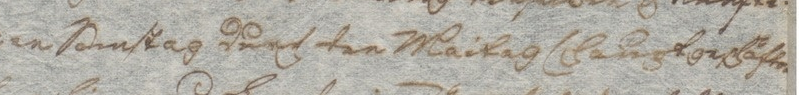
gen Samstag durch den Maitag (Hauptgeschäfts-
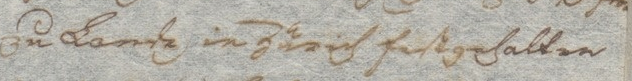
zu Lande) in Zürich festgehalten
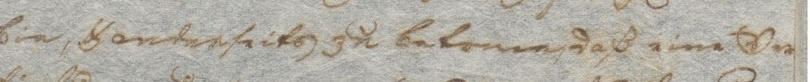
bin, & anderseits zu betonen, daß eine Ver-
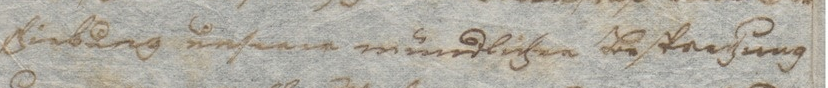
schiebung unserer mündlichen Besprechung
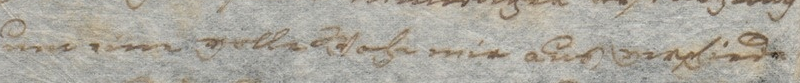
um eine volle Woche mir aus verschiede-
